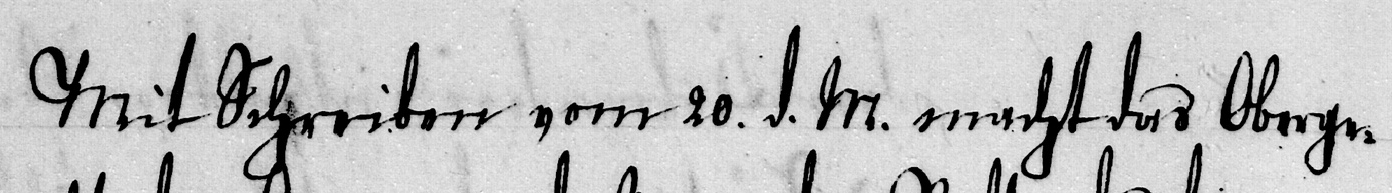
Mit Schreiben vom 20. d. M. macht das Oberge¬
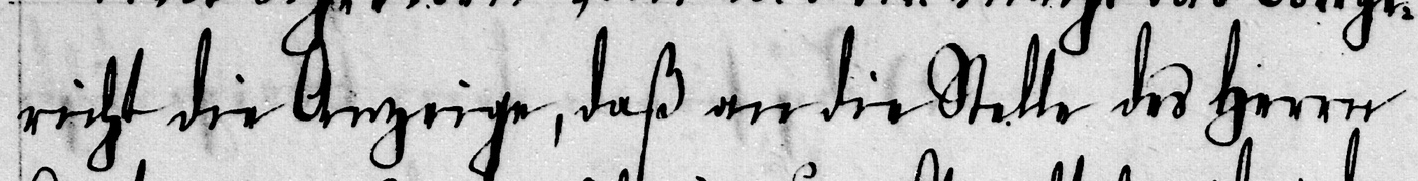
richt die Anzeige, daß an die Stelle des Herrn
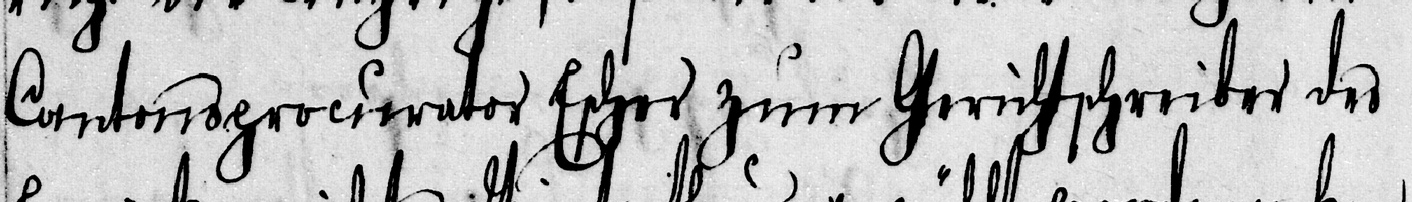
Cantonsprocurator Escher zum Gerichtschreiber des
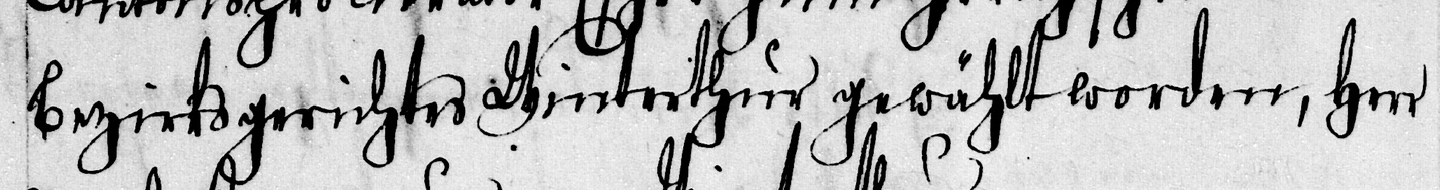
Bezirksgerichtes Winterthur gewählt worden, Herr
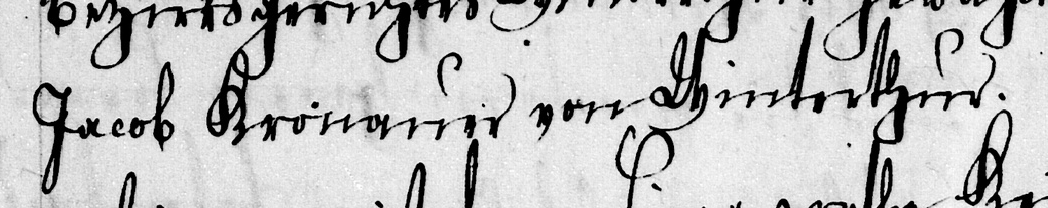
Jacob Kronauer von Winterthur.
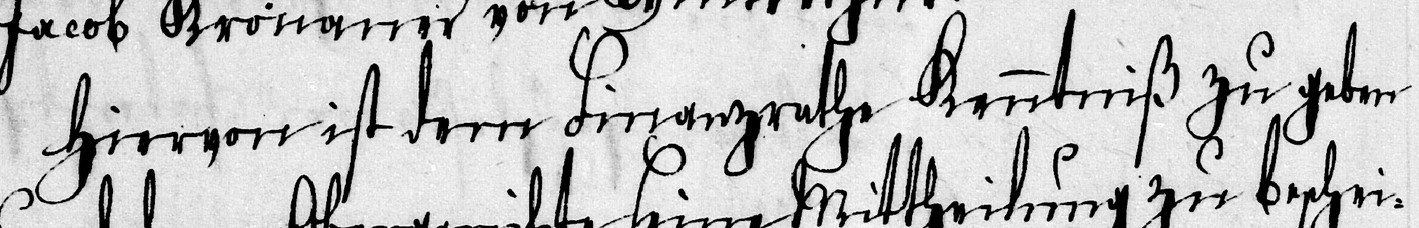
Hiervon ist dem Finanzrathe Kenntniß zu geben
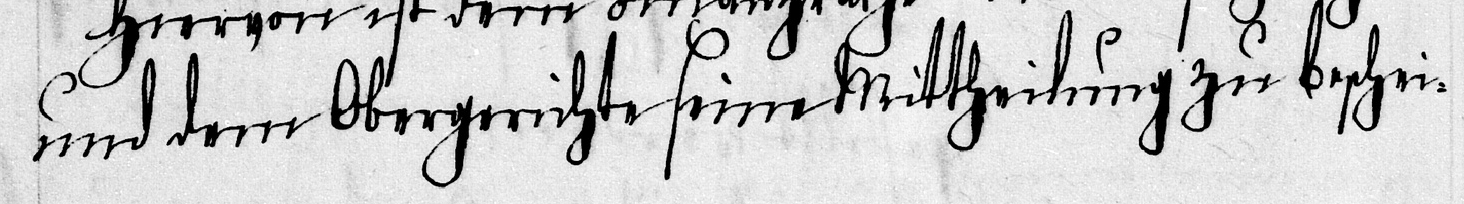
und dem Obergerichte seine Mittheilung zu besche¬
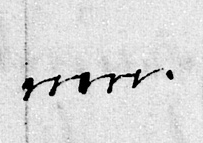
inen.
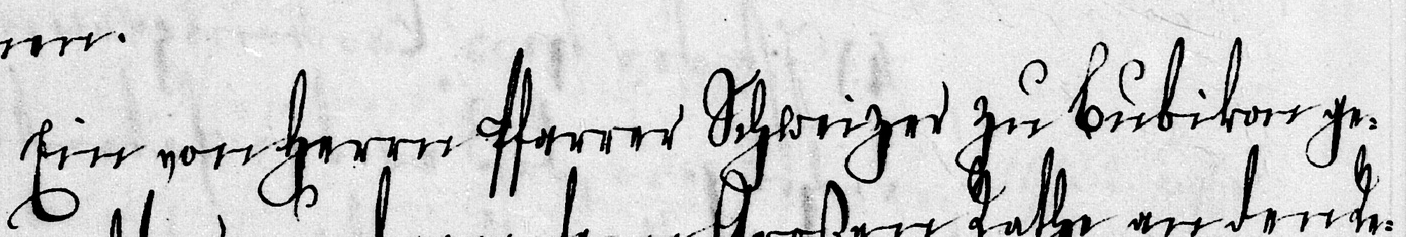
Ein von Herrn Pfarrer Schweizer zu Bubikon ge¬
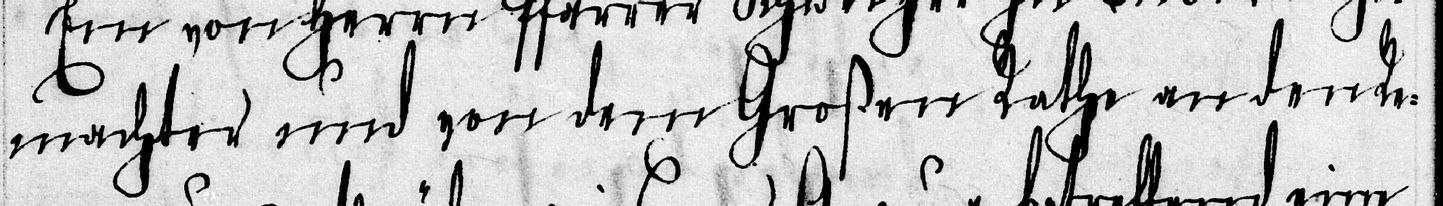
machter und von dem Großen Rathe an den Re¬
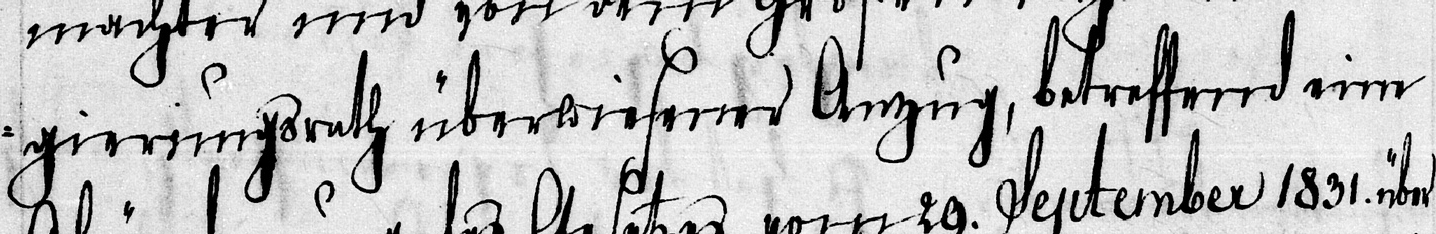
gierungsrath überwiesener Anzug, betreffend eine
